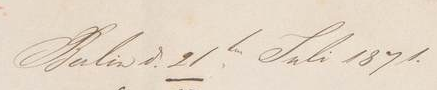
Berlin, d. 21ten Juli 1871 .
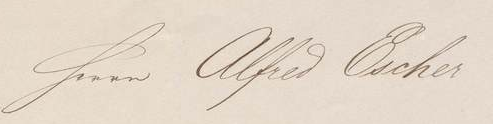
Herrn Alfred Escher
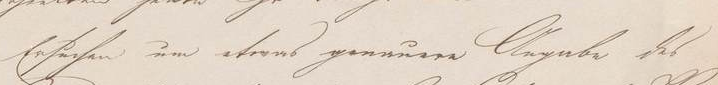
«Ersuchen um etwas genauere Angabe des
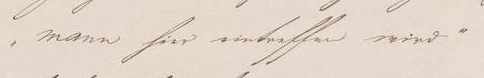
mann hier eintreffen wird»
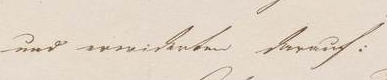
und erwiderten darauf:
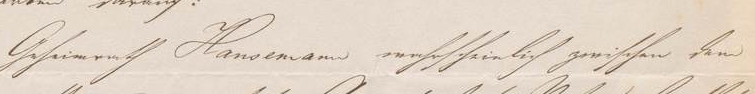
«Geheimrath Hansemann wahrscheinlich zwischen dem
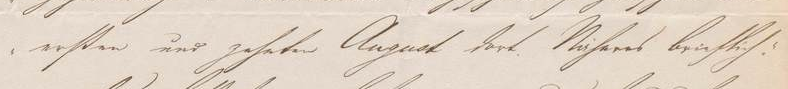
ersten und zehnten August dort. Näheres brieflich.»
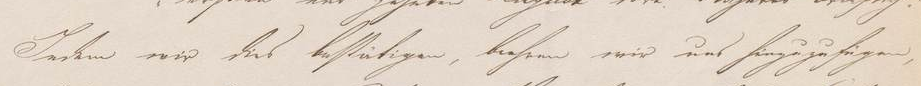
Indem wir dies bestätigen, beehren wir uns hinzuzufügen,
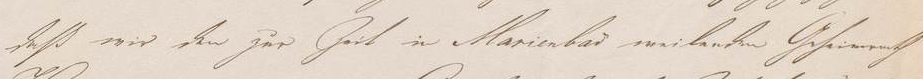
daß wir den zur Zeit in Marienbad weilenden Geheimrath
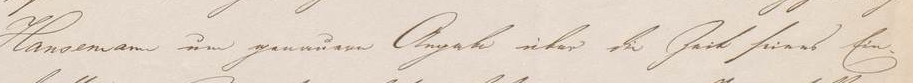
Hansemann um genauere Angabe über die Zeit seines Ein-
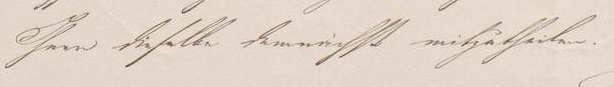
Ihnen dieselbe demnächst mitzutheilen.
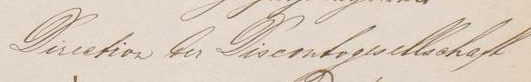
Direction der Discontogesellschaft
